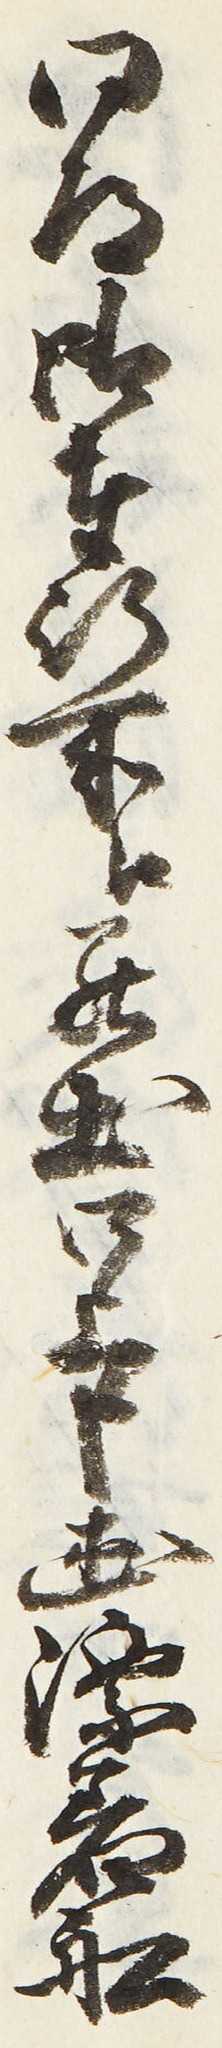同道御奉行所江罷出口上申述漂着船
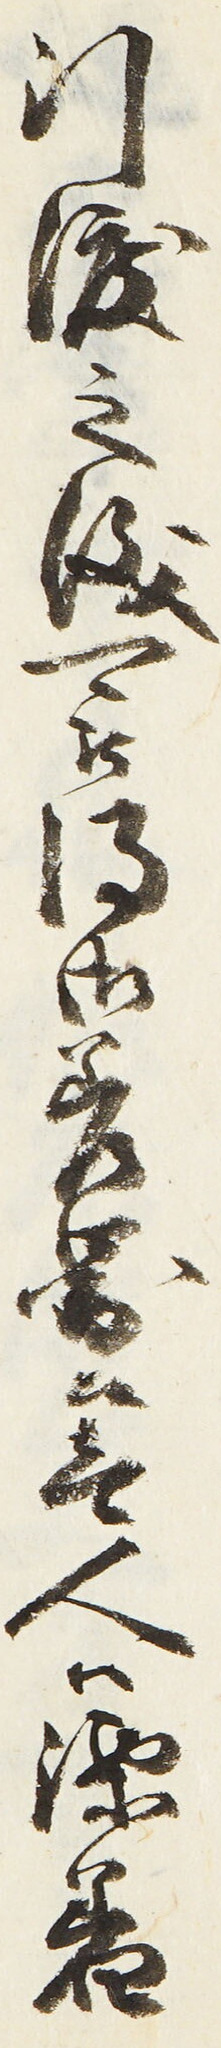引渡之儀可被得御差図候壱人ハ漂着
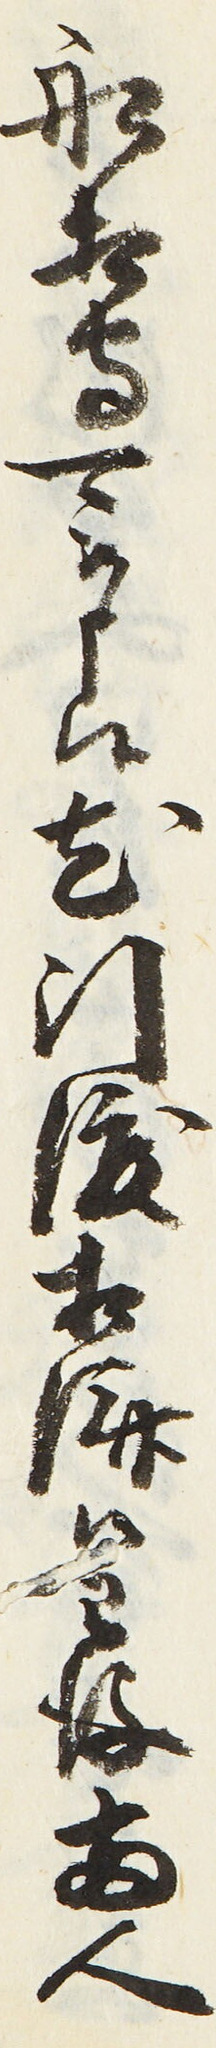船相守可被申候尤引渡相済候已後両人

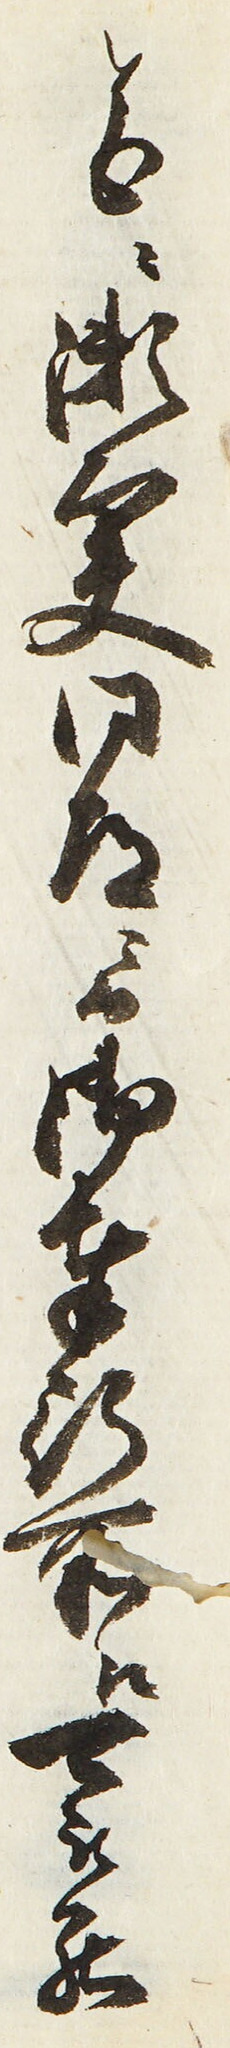ともニ瀬大夫同道ニ而御奉行所江可被罷
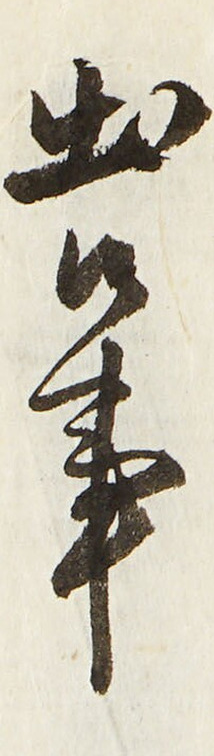出候事
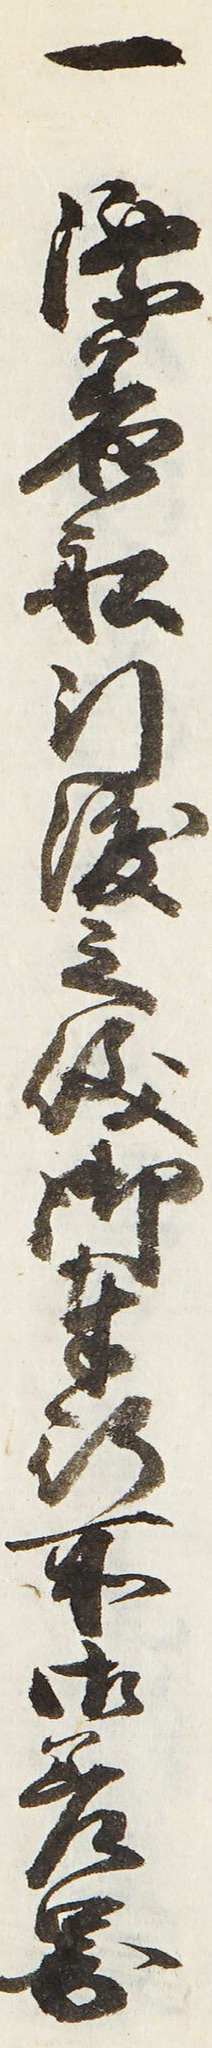一漂着船引渡之儀御奉行所御差図
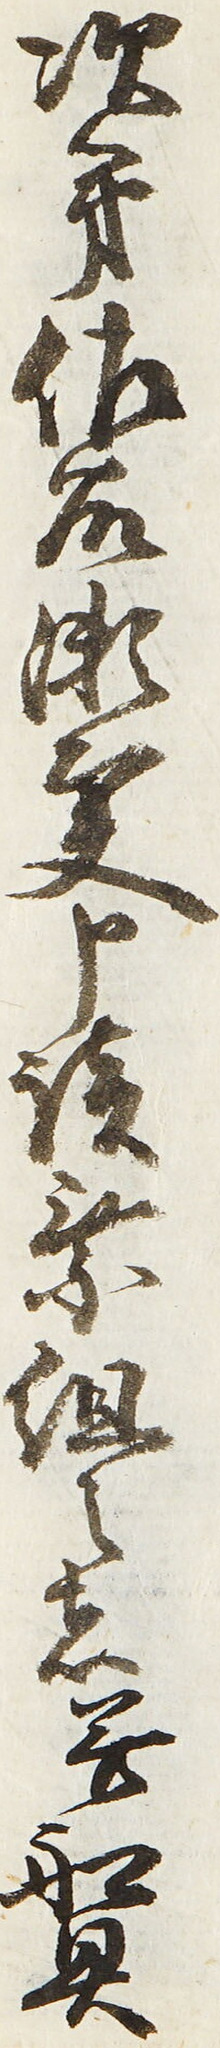次第佐藤瀬大夫申談乗組之者并船具
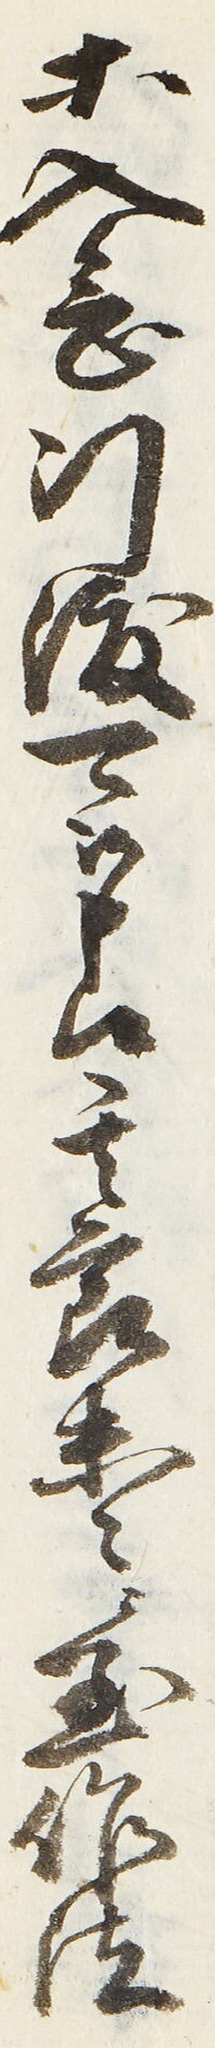等入念引渡可被申候其節末々ニ至作法
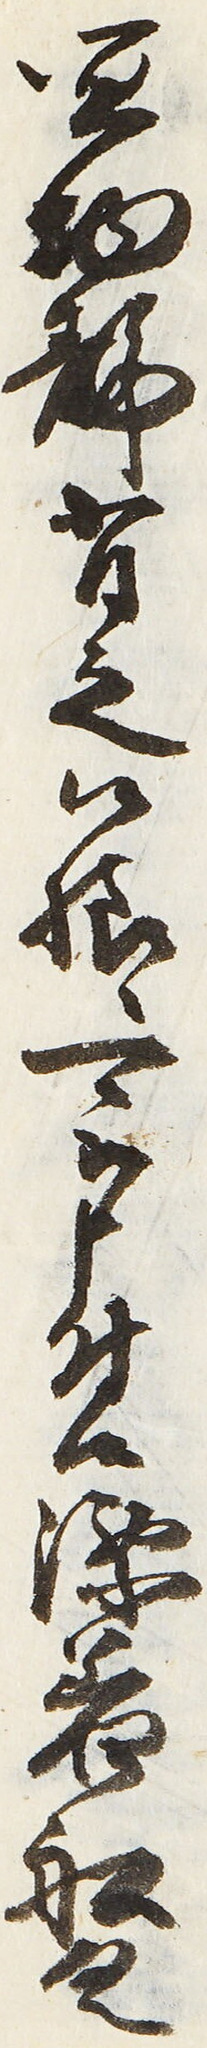宜物静有之候様ニ可被申付候漂着船具
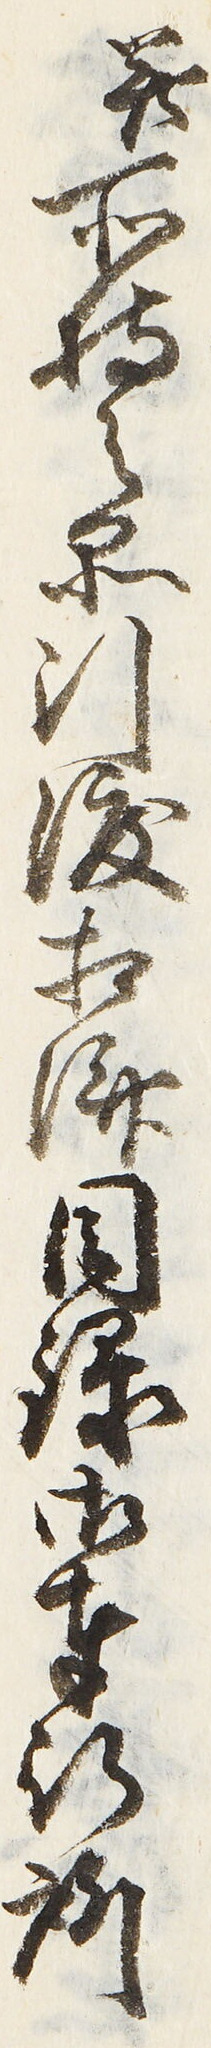并所持之品引渡相済目録御奉行所
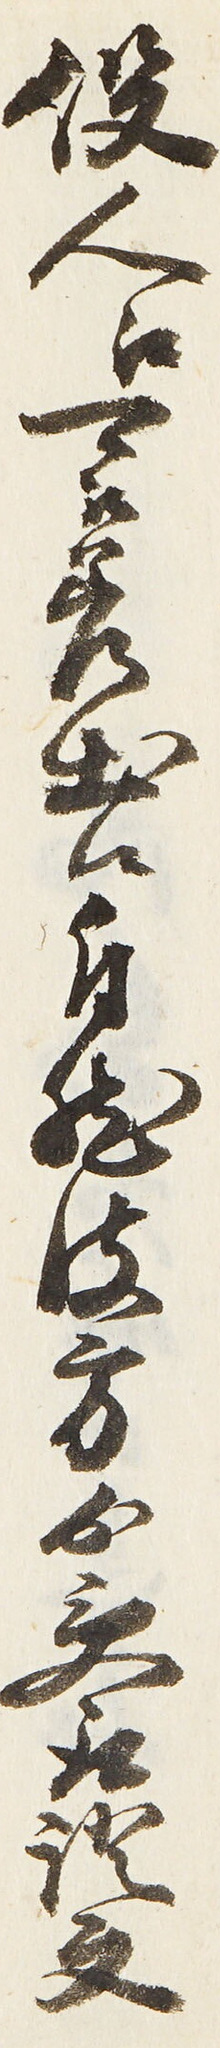役人江可被差出候自然役方ゟ受取証文
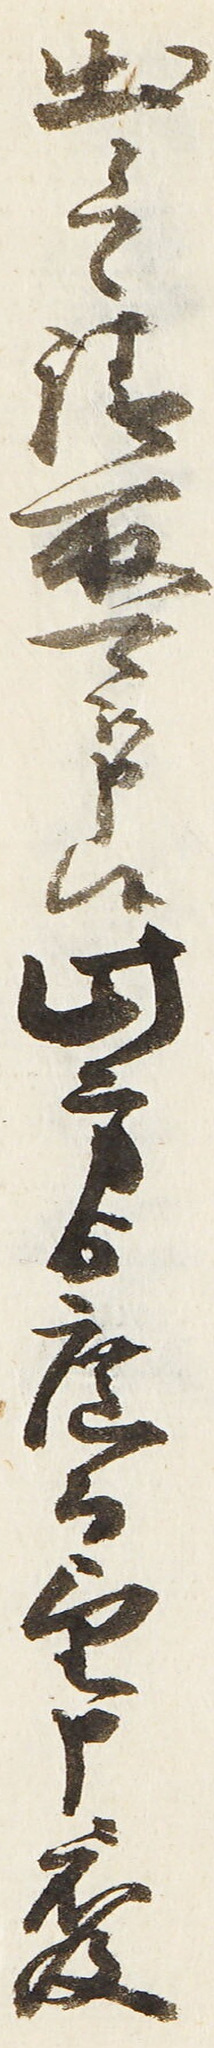出候ハヽ請取可被申候此方ゟ庶而望申ニ不及
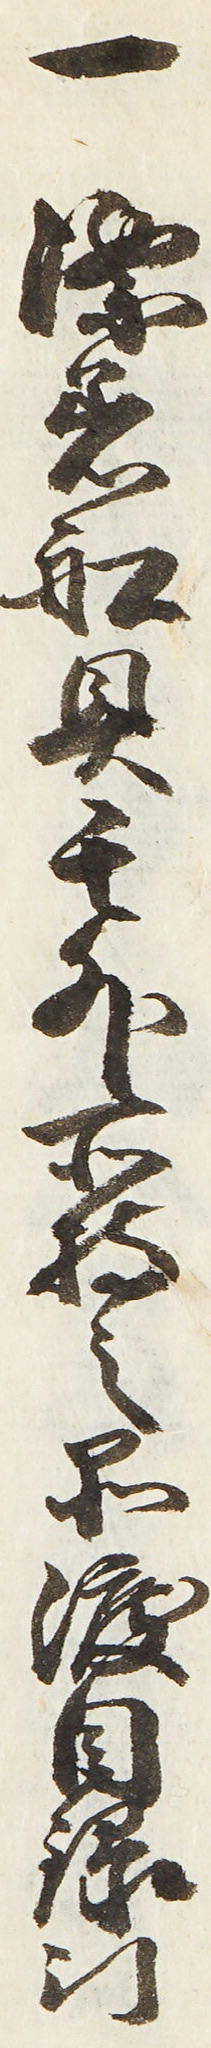一漂着船具其外所持之品渡目録引
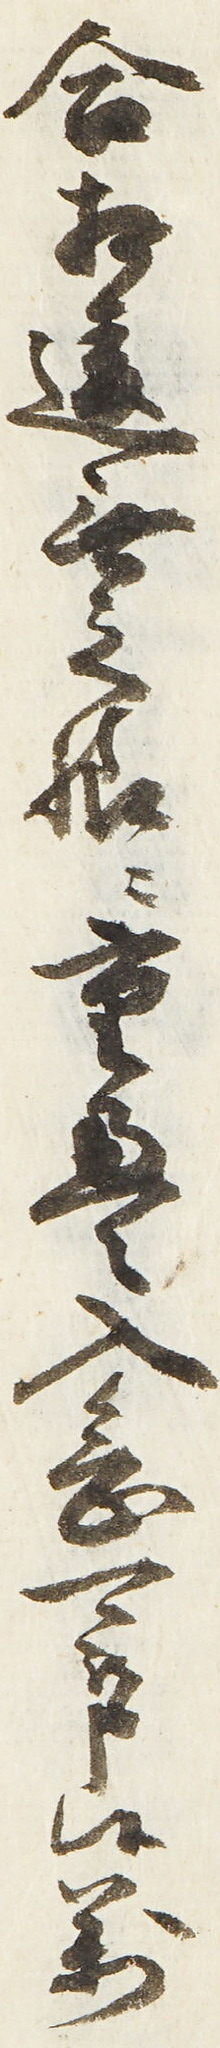合相違無之様ニ重畳入念可被申候万
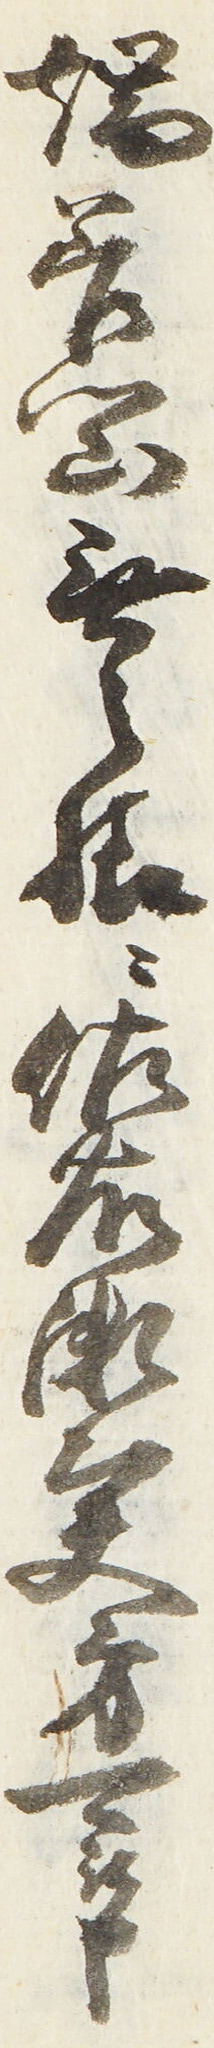端差無之様ニ佐藤瀬大夫方可被申
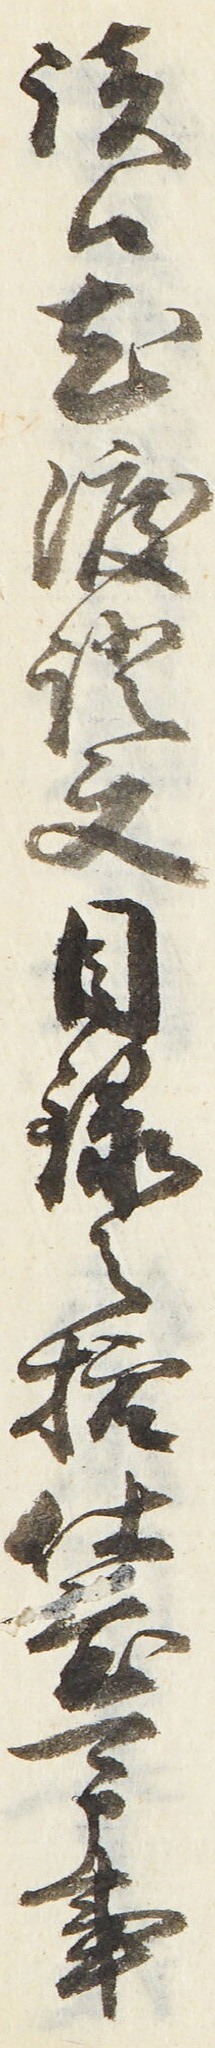談候尤渡証文目録之控仕置可申事
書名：玄海嶋江漂着船為警固長崎江被越候覚
